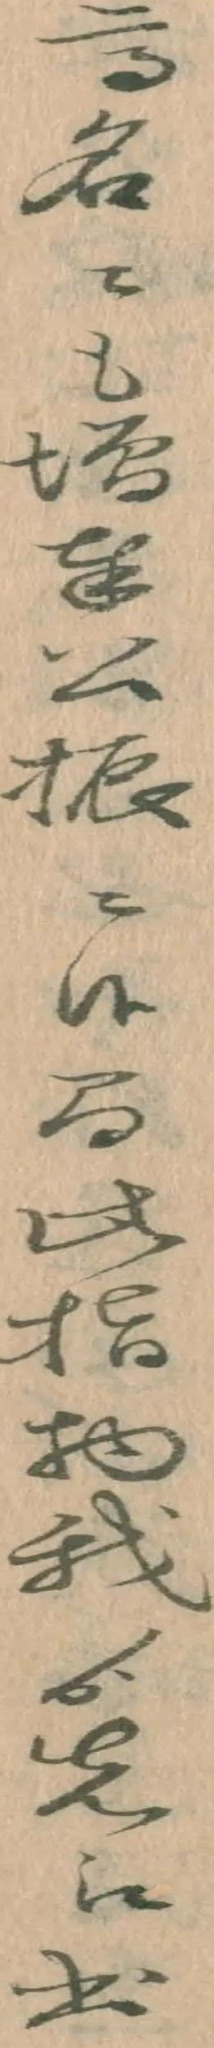高名にも増奉公振に候間此指物我ゟ先江出
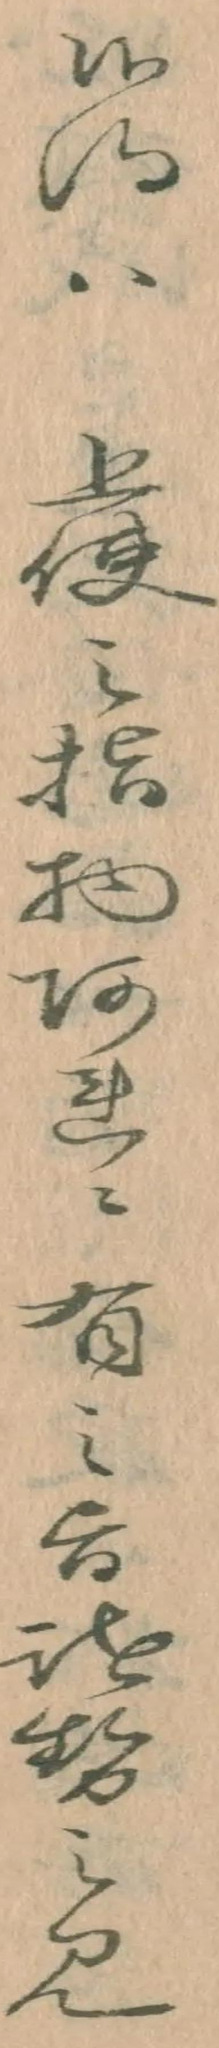候得は上使之指物阿連に有之旨諸勢之見
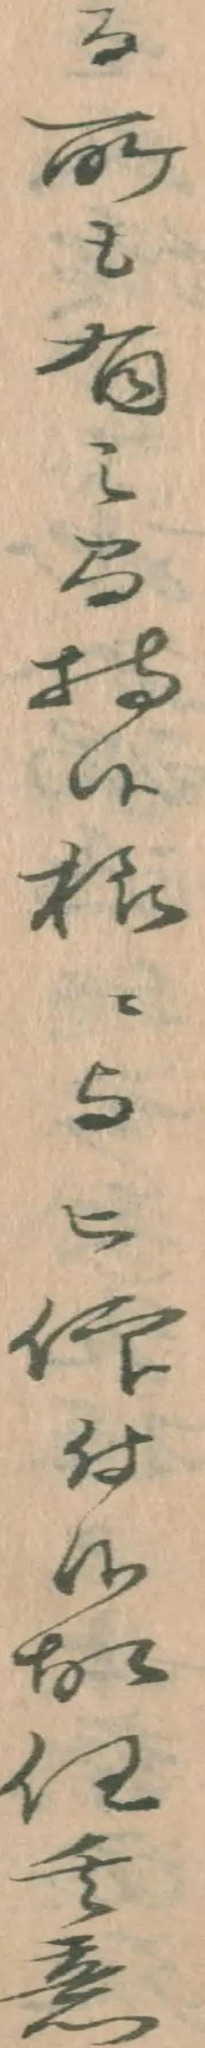る所も有之間持候様に与被仰付候故任其意
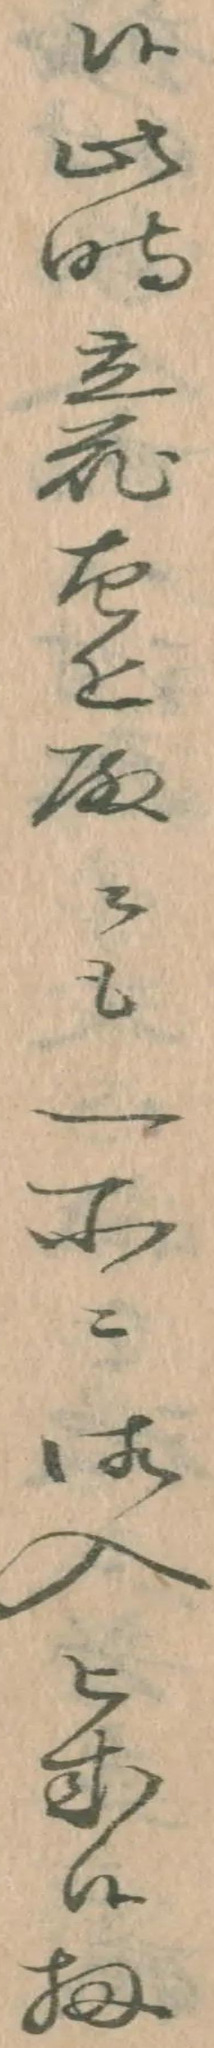候此時立花左近殿にも一所に御入被成候扨
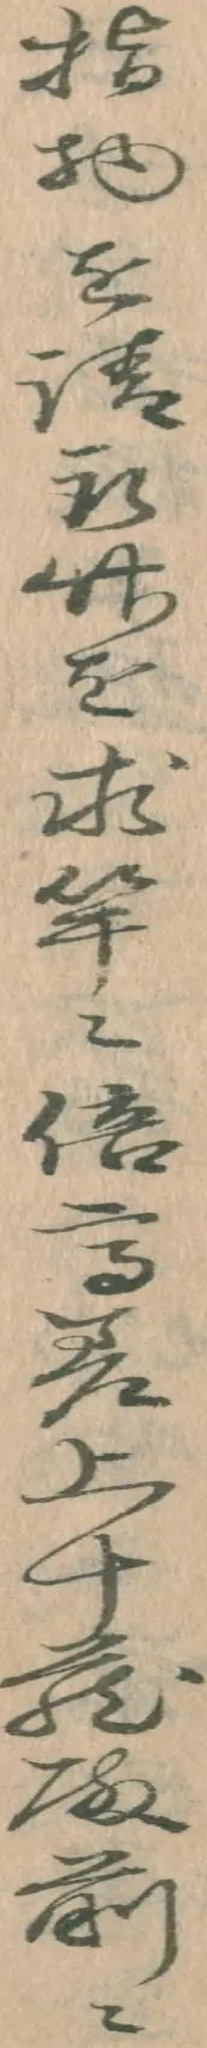指物を請取竹を求竿に倍高差上十蔵殿前に
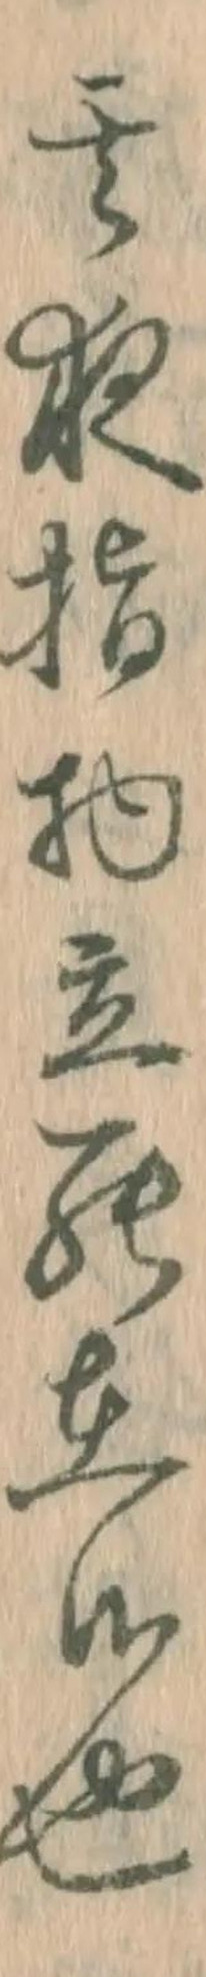其夜指物立罷在候也
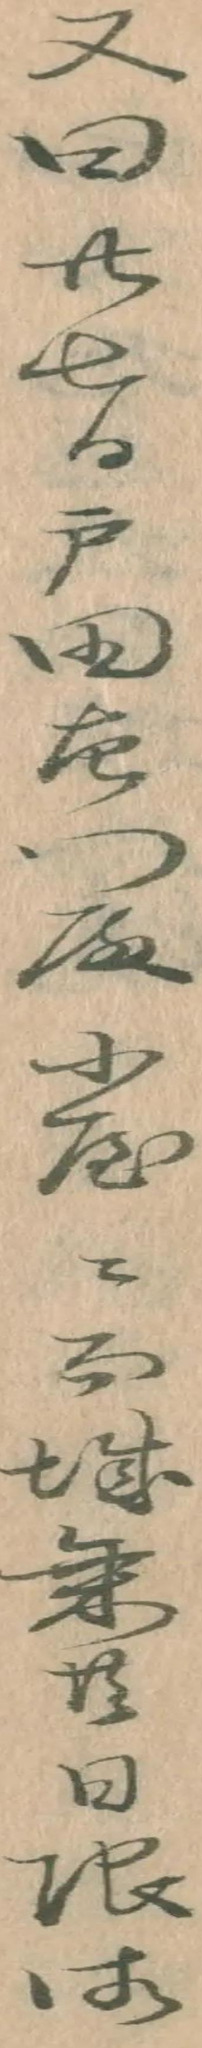又曰廿七日戸田左門殿小屋に而城乗共日限御
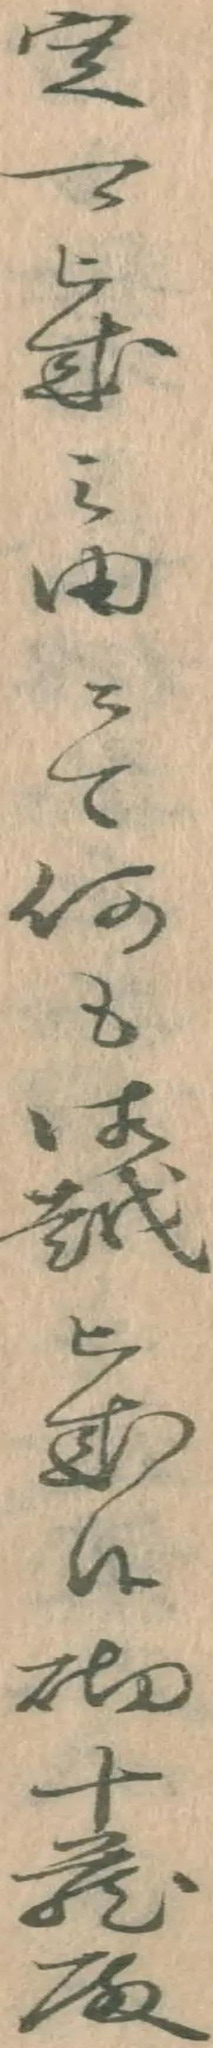定可被成之由にて何も御越被成候砌十蔵殿
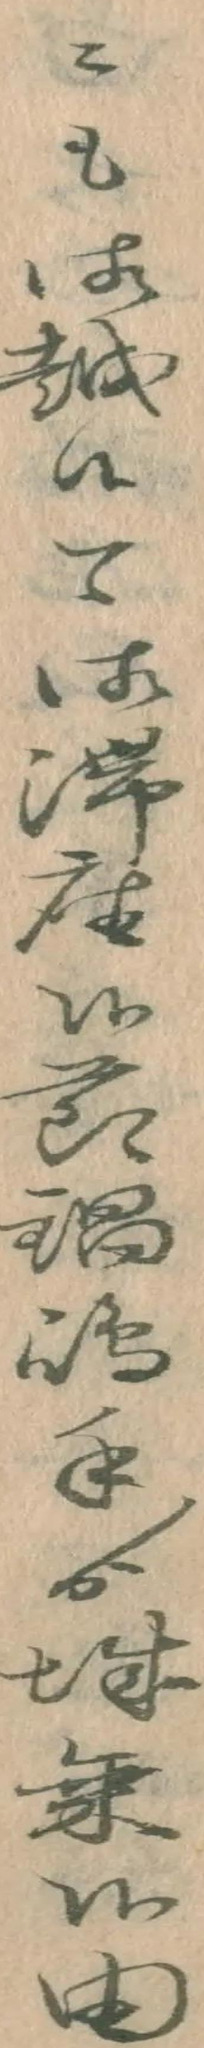にも御越候て御滞座候節鍋島手ゟ城乗候由
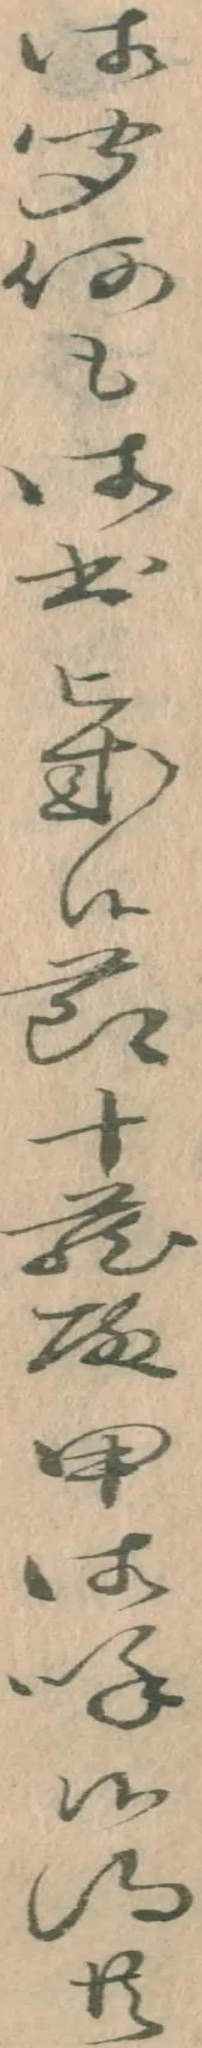御聞何も御出被成候節十蔵殿甲御呼候得共
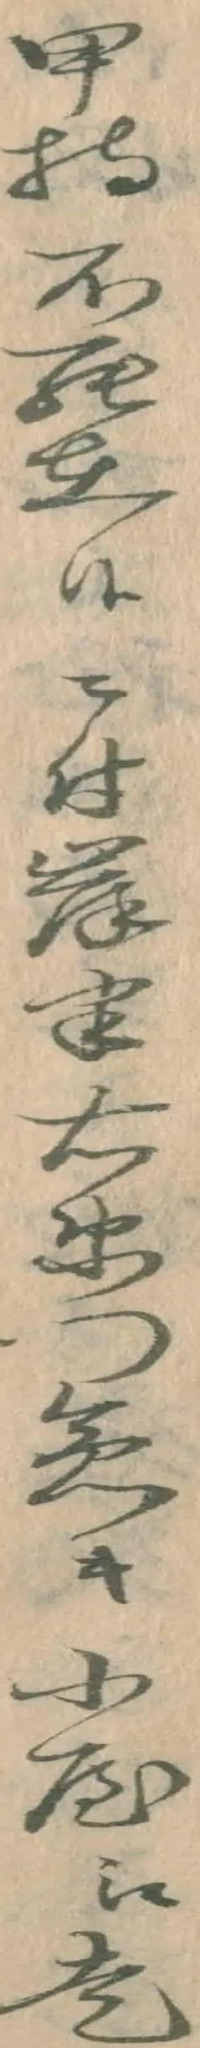甲持不罷在候に付岸半右衛門急き小屋江走
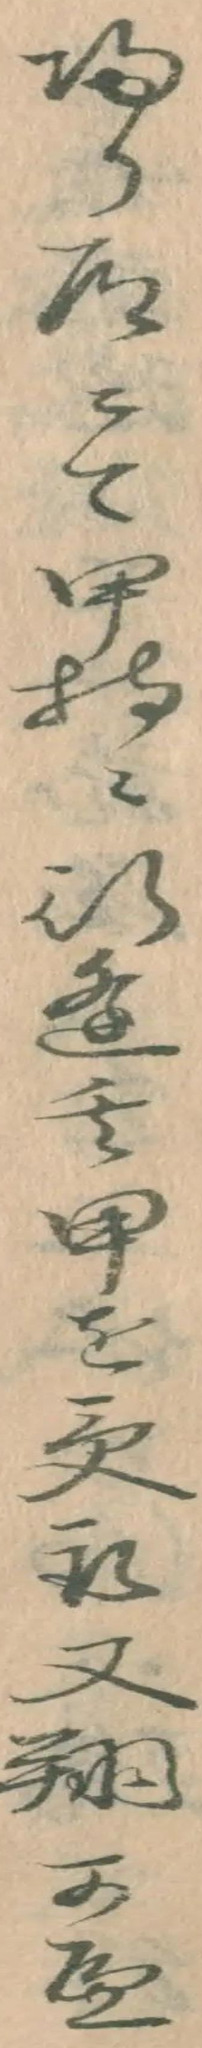帰り道にて甲持に行逢其甲を受取又翔可扁

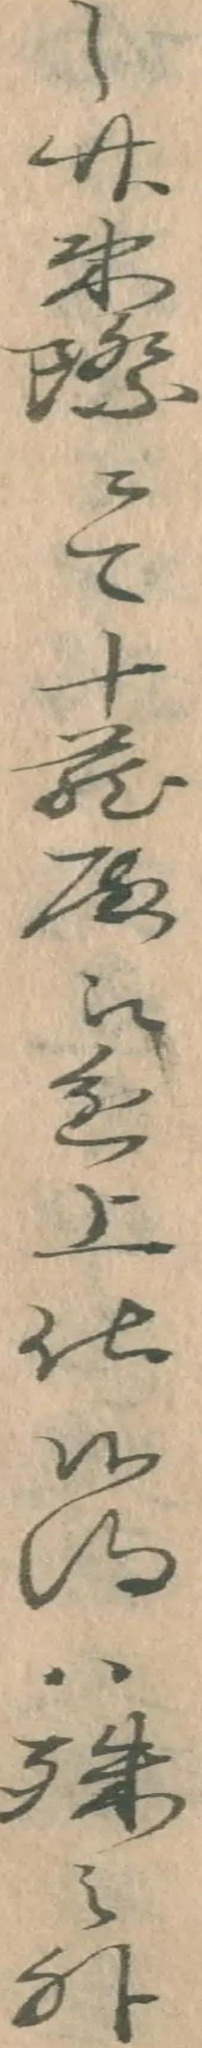し竹束際にて十蔵殿江進上仕候得は殊之外
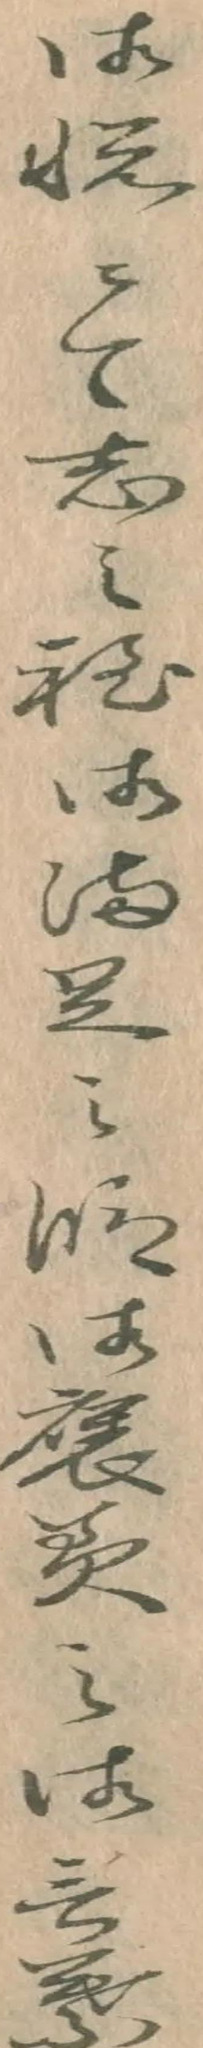御悦にて志之程御満足之段御褒美之御言葉
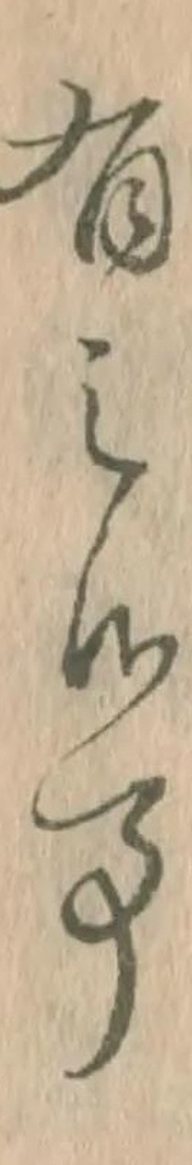有之候事
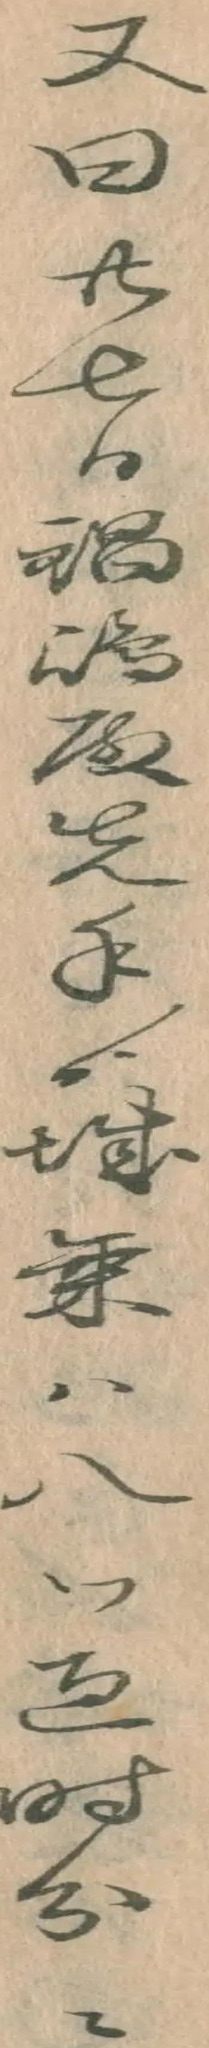又曰廿七日鍋島殿先手ゟ城乗は八つ過時分に
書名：切支丹御退治記 49巻. [8]
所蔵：国立国会図書館 National Diet Library, JAPAN
